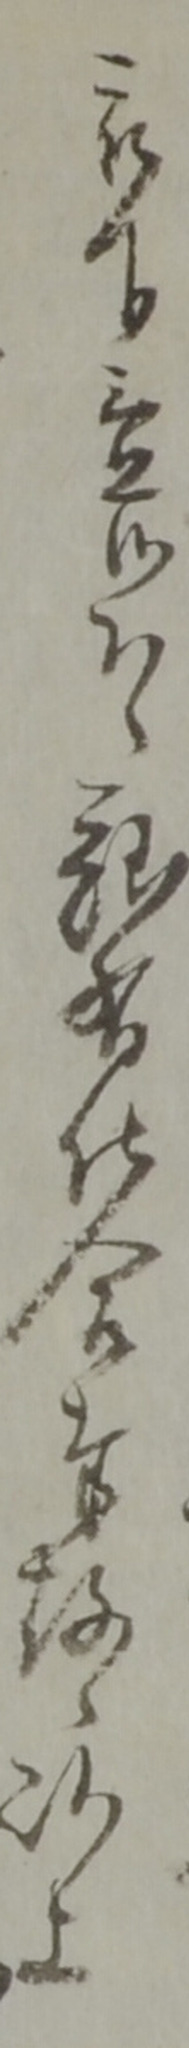被下置候ハヽ難有仕合奉存候以上
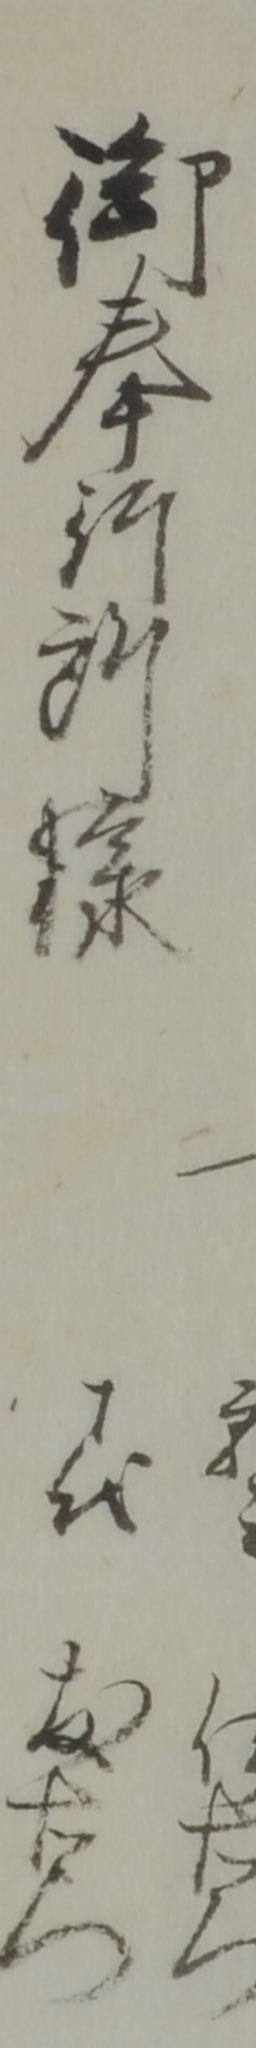御奉行所様丁代藤右衛門
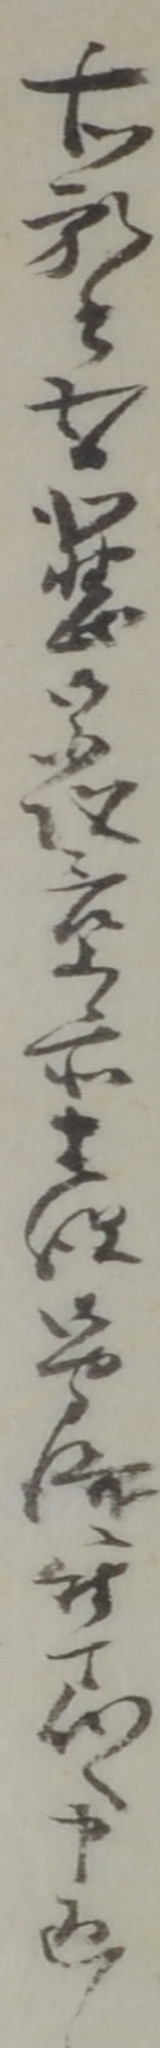右願書五日北野氏御取次差上候所直様御聞済ニ付丁代へ申通
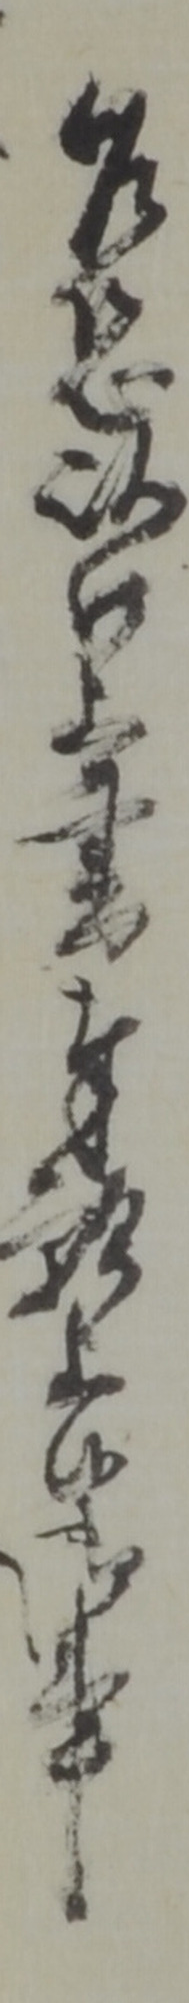乍恐以口上書奉願上候御事
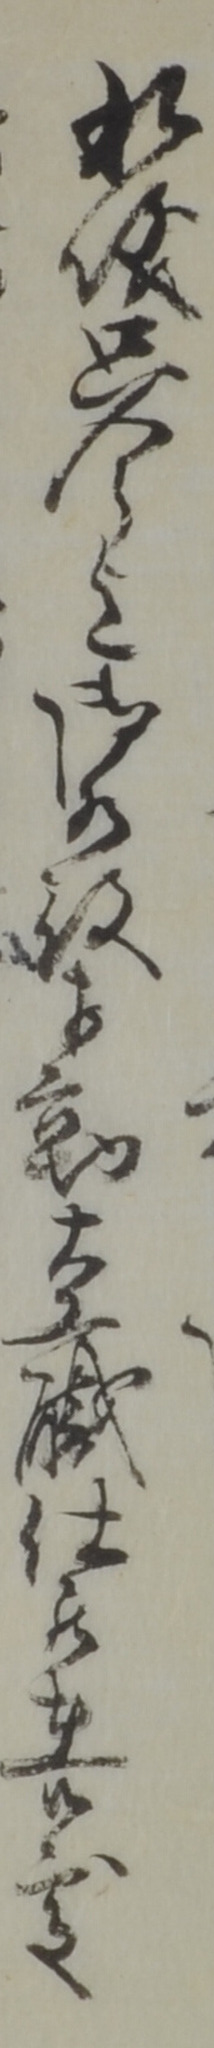私儀只今迄御水役相勤大工職仕罷在候處
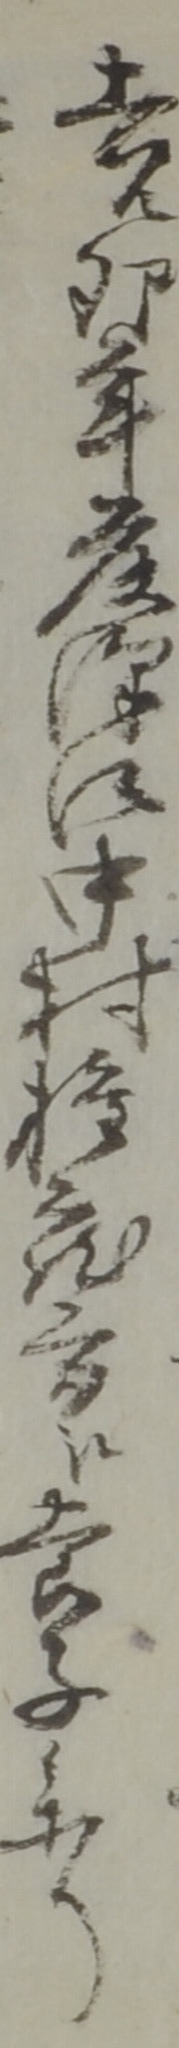去ル卯年藤澤郷中村権蔵方江養子ニ成り
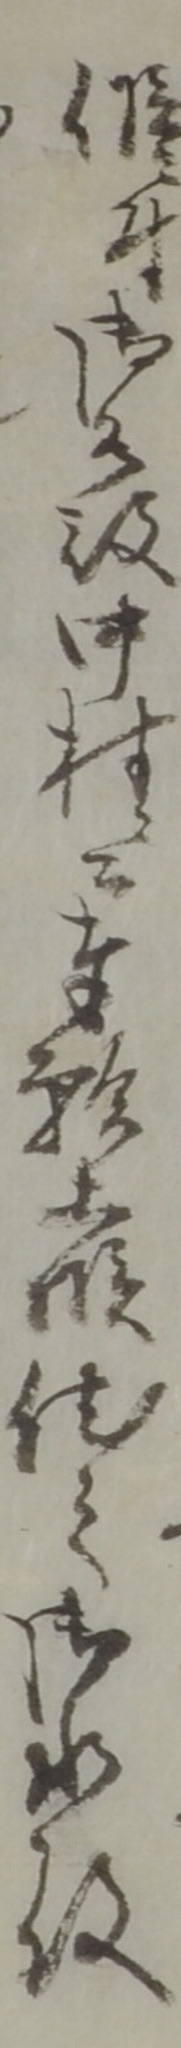候ニ付御水役中村ニ而奉願上候依之御水役
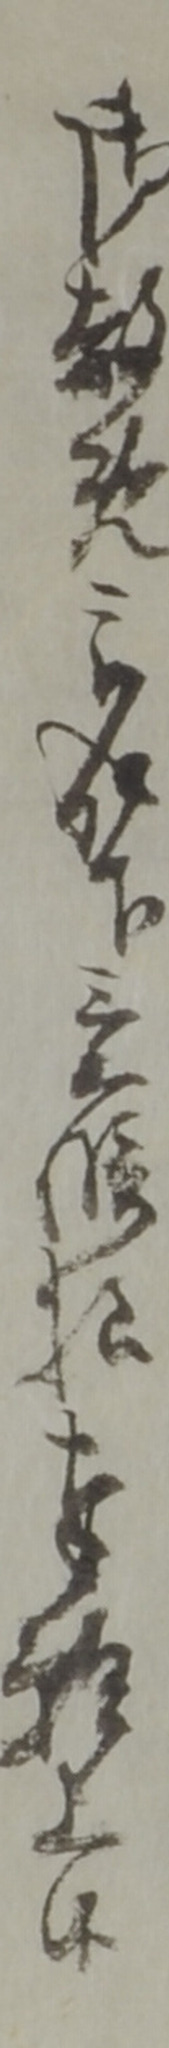御赦免被成下置候様奉願上候
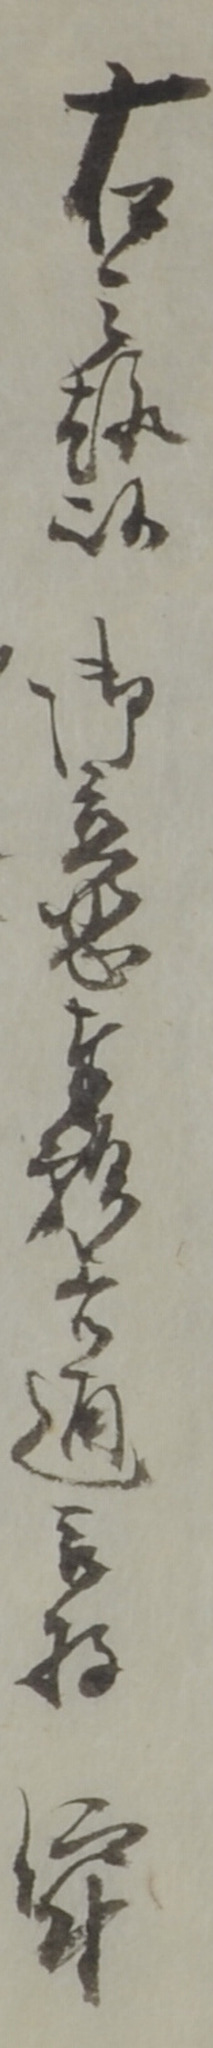右之趣以御慈悲奉願上候通被為仰付
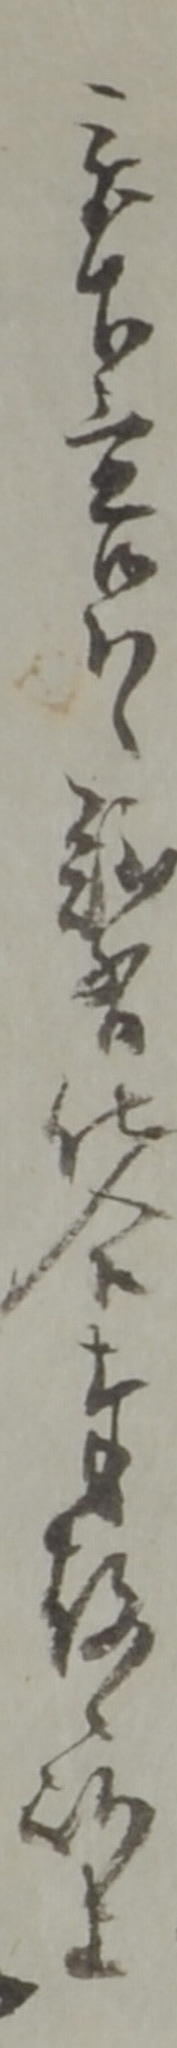被下置候ハヽ難有仕合奉存候以上
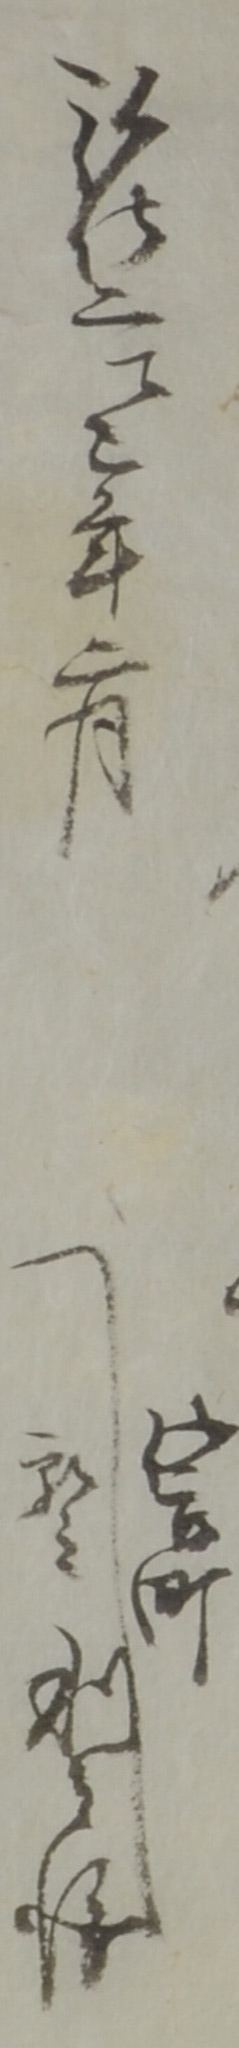弘化二乙巳年二月願主利兵衛
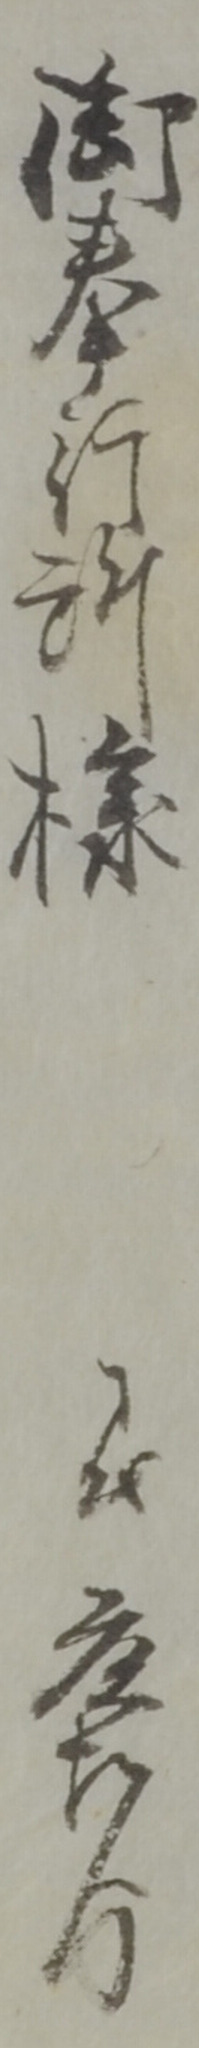御奉行所様丁代藤左衛門

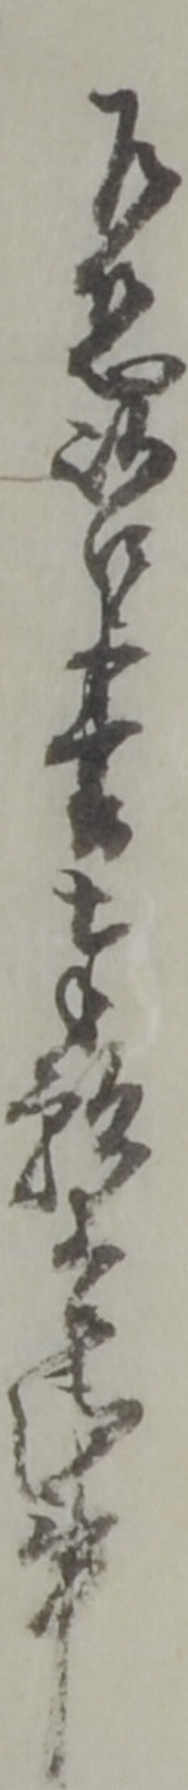乍恐以口上書奉願上候御事
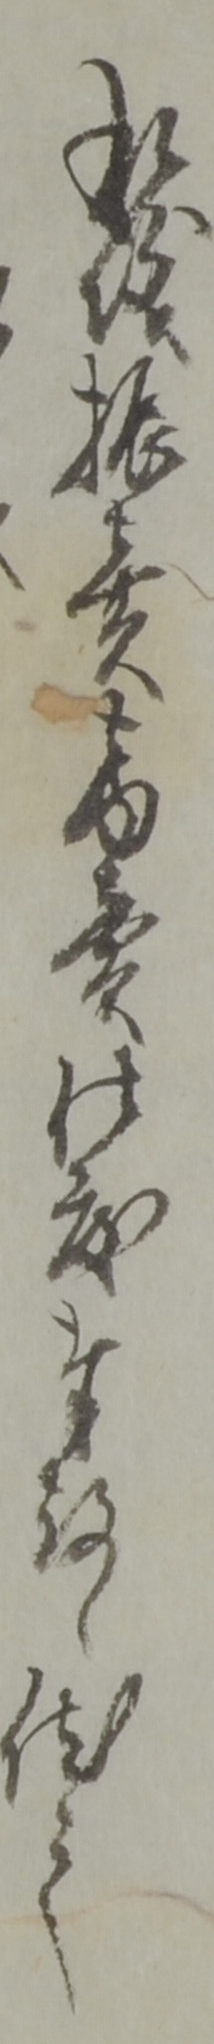私儀振売商売此度奉存候依之
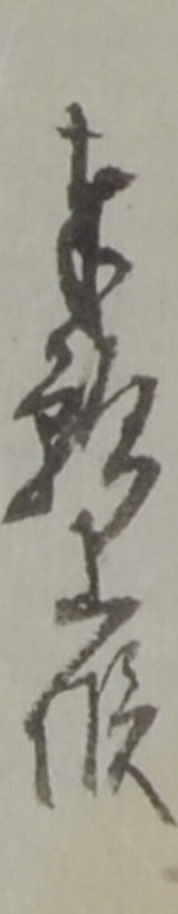奉願上候
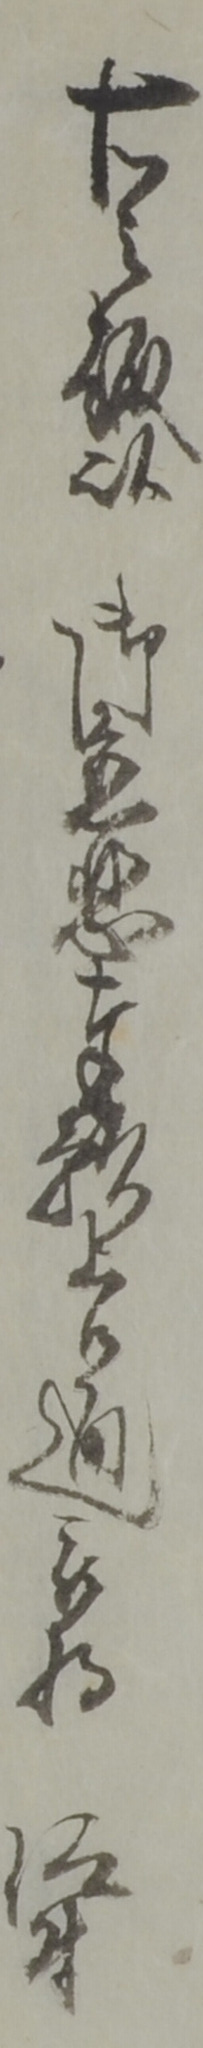右之趣以御慈悲奉願上候通被為仰付
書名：諸願書控簿
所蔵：伊那市立高遠町図書館・合同会社AMANE
